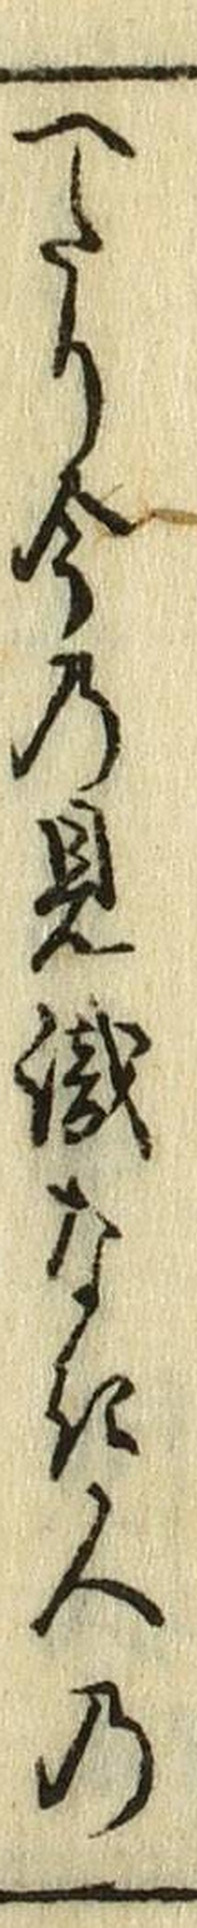へたり今の見識なき人の
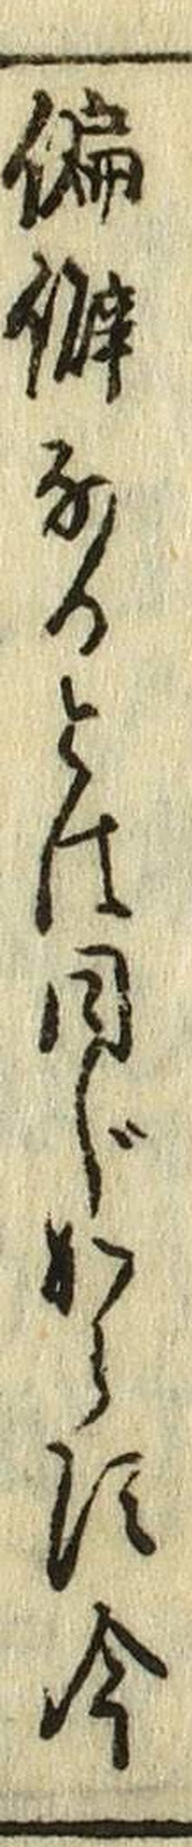偏僻なるとは同じからす今
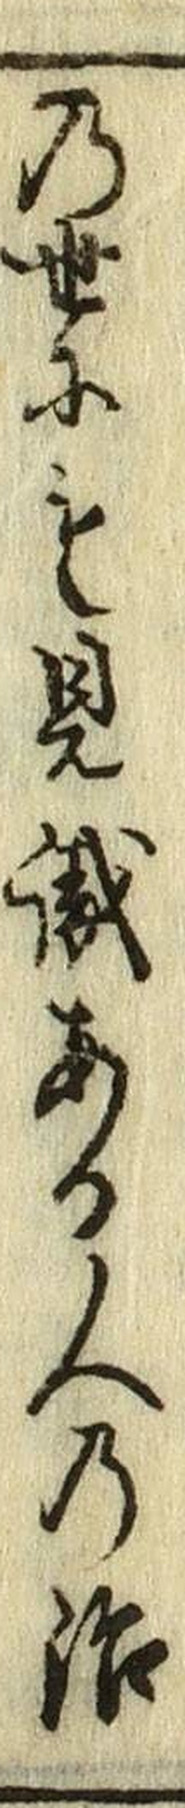の世にも見識ある人の治
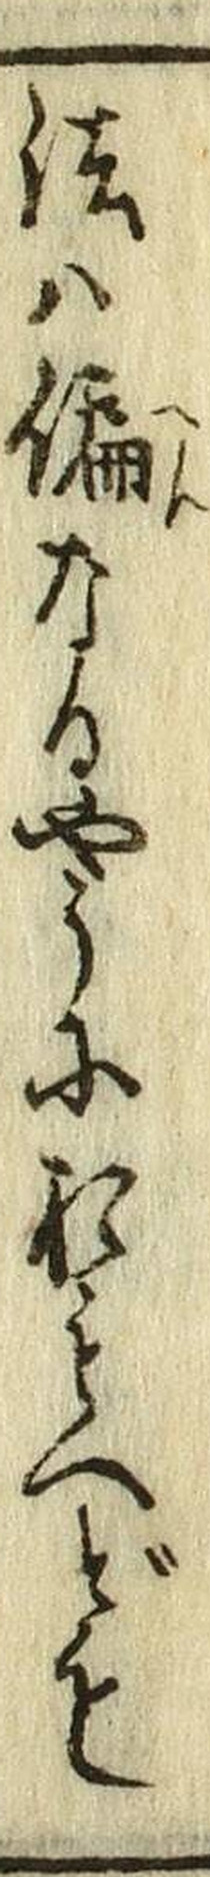法は偏なるやうにおもへども
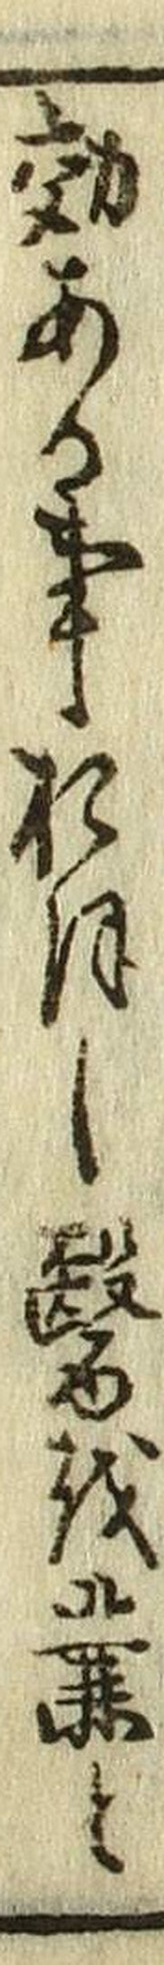効ある事おほし医を業と
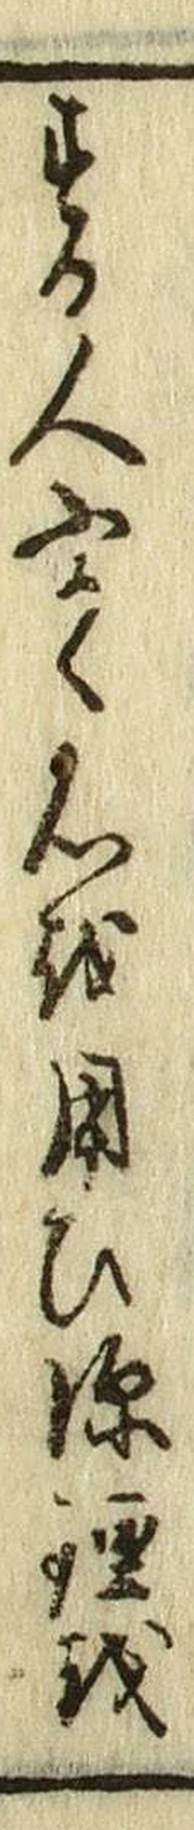する人ふかく心を用ひ深理を
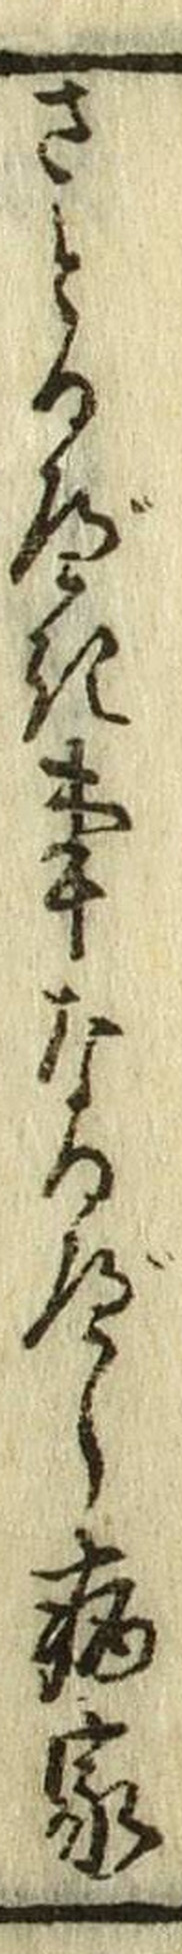さとるべき事なるべし病家
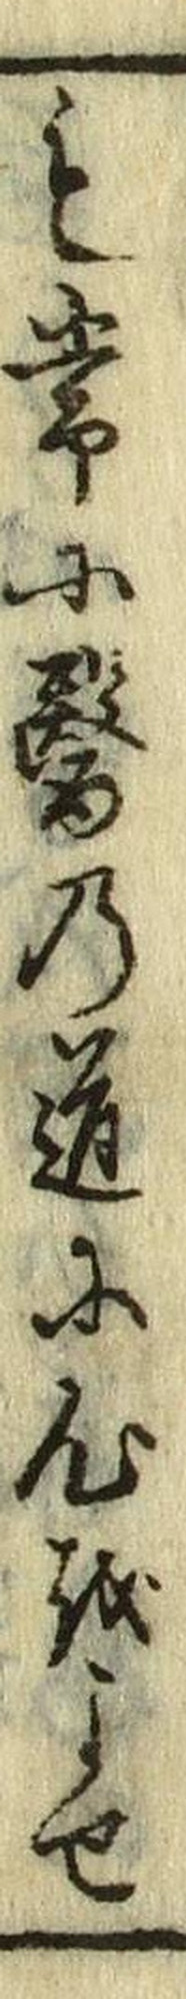も常に医の道に心をよせ

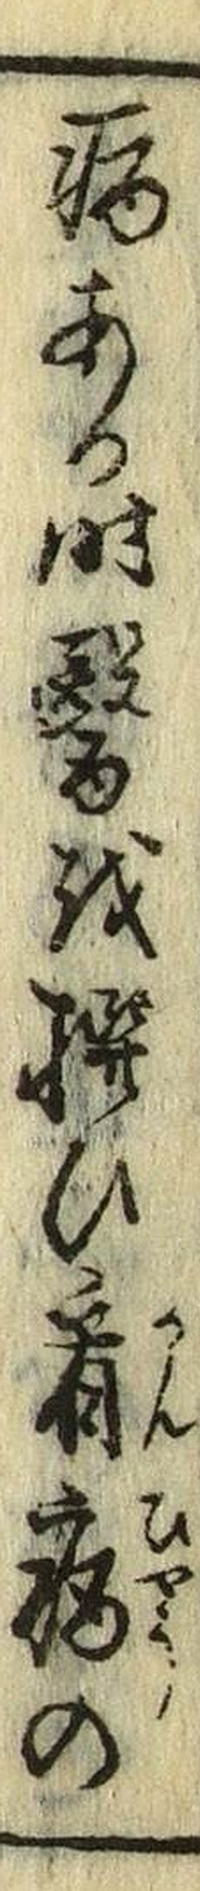病ある時医を撰ひ看病の
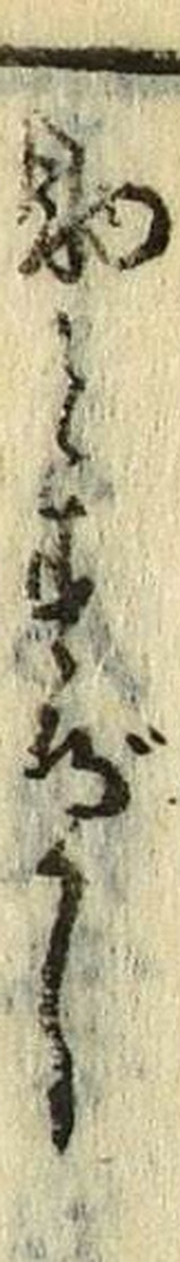助とすべし
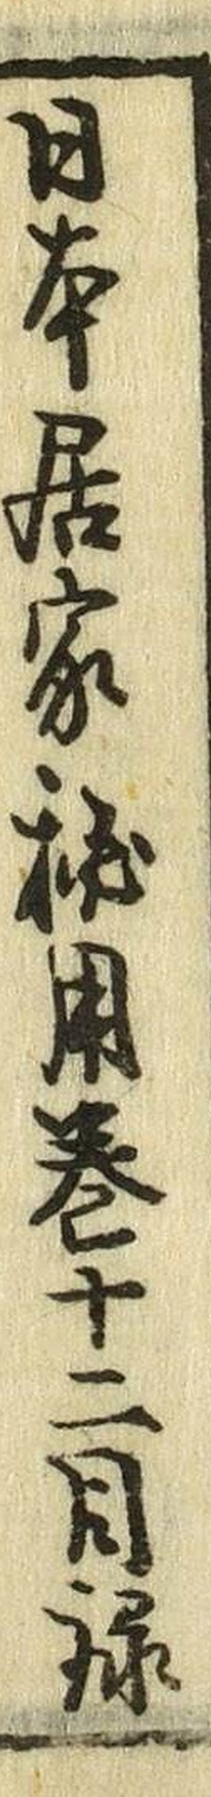日本居家秘用巻十二目録
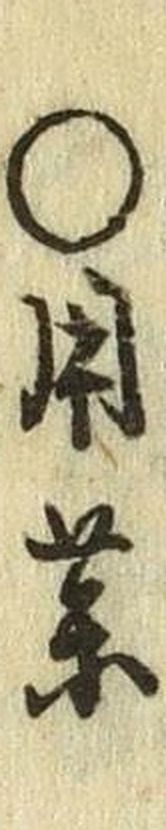○用薬
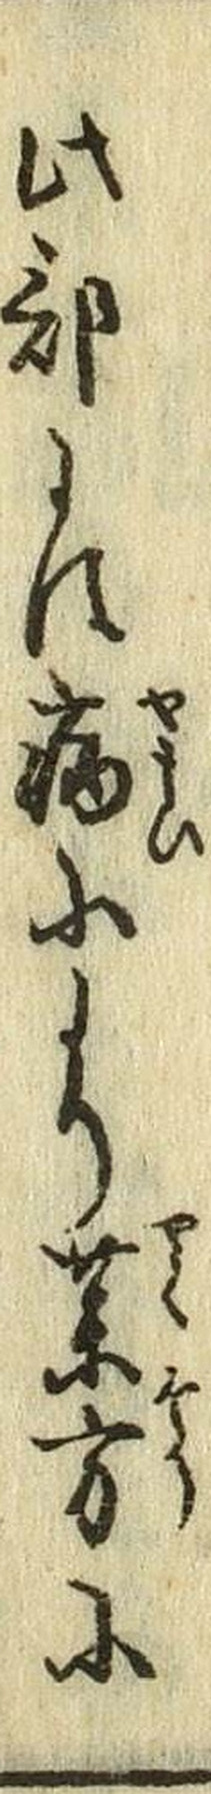此部には病により薬方に
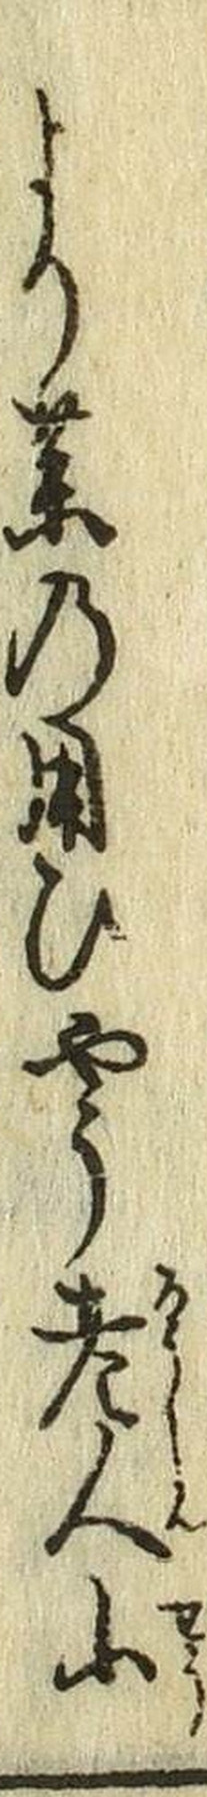より薬の用ひやう老人小
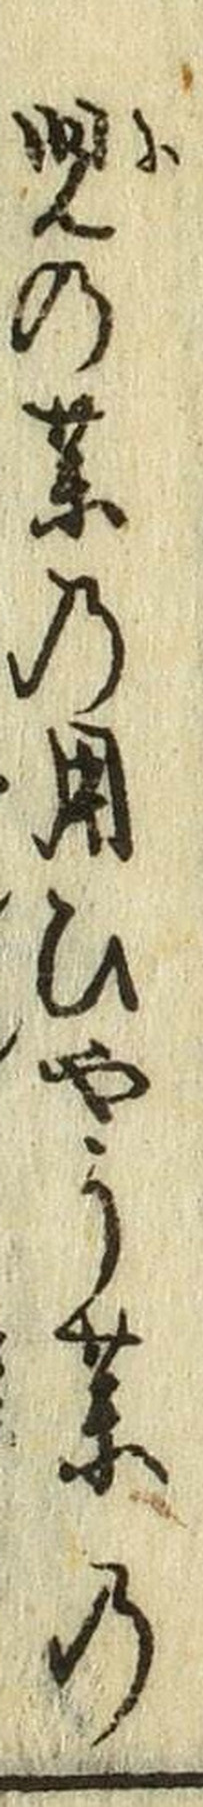児の薬の用ひやう薬の
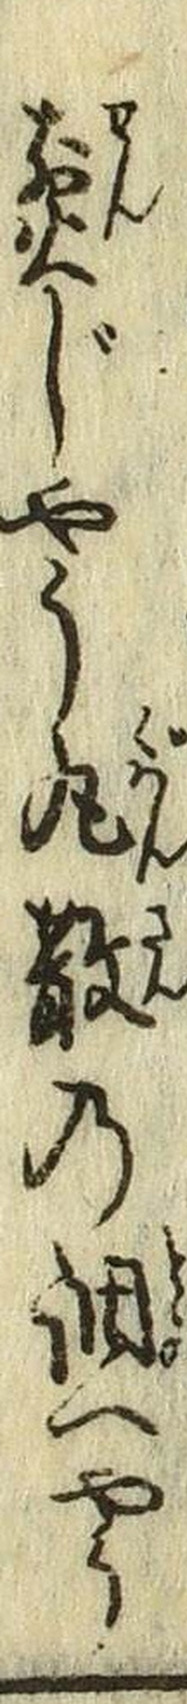煎じやう丸散の調へやう
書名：居家養生記
